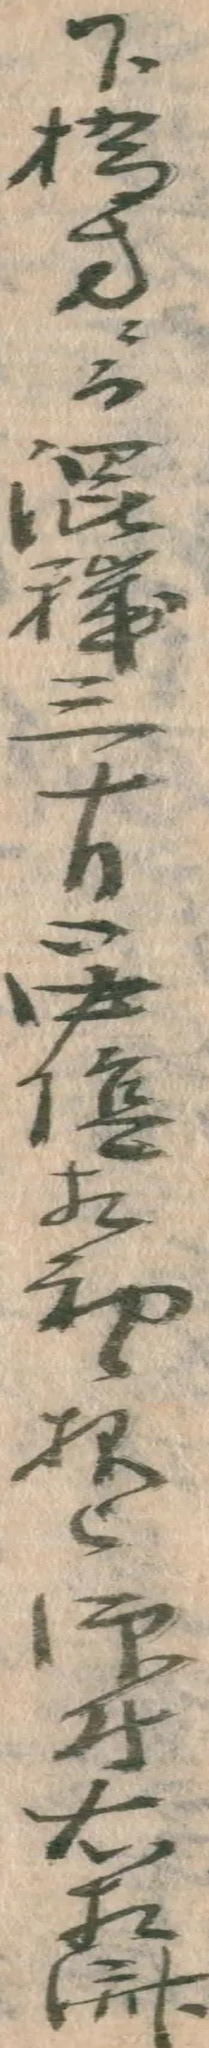下橋方ニ而混穢、三十日御中陰相勤候様被仰付、右相済
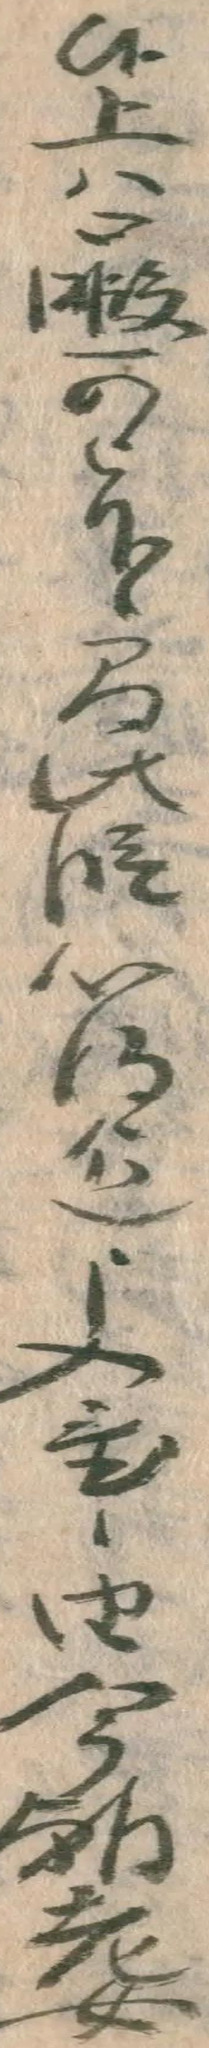候上ハ、御暇可被下候間、此段心得迄申入置候由、今朝老女
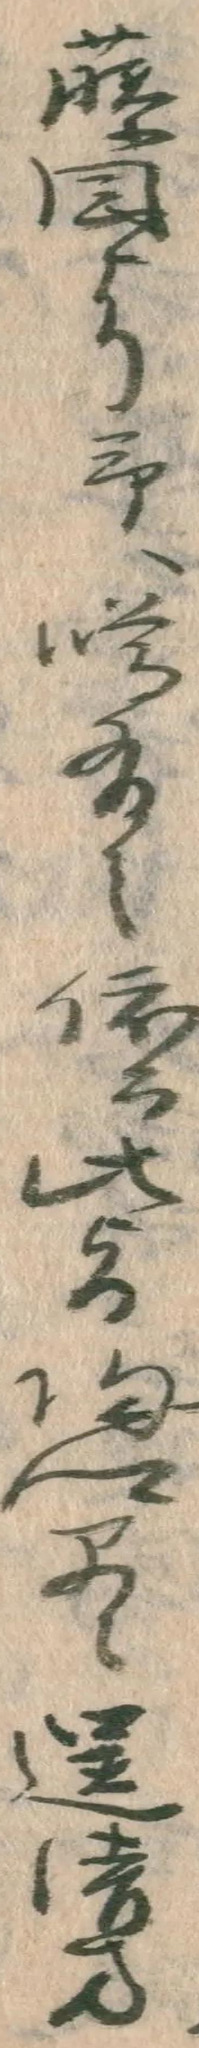藤岡より予へ噂有之、依て而此旨帰郷早〻逞清方
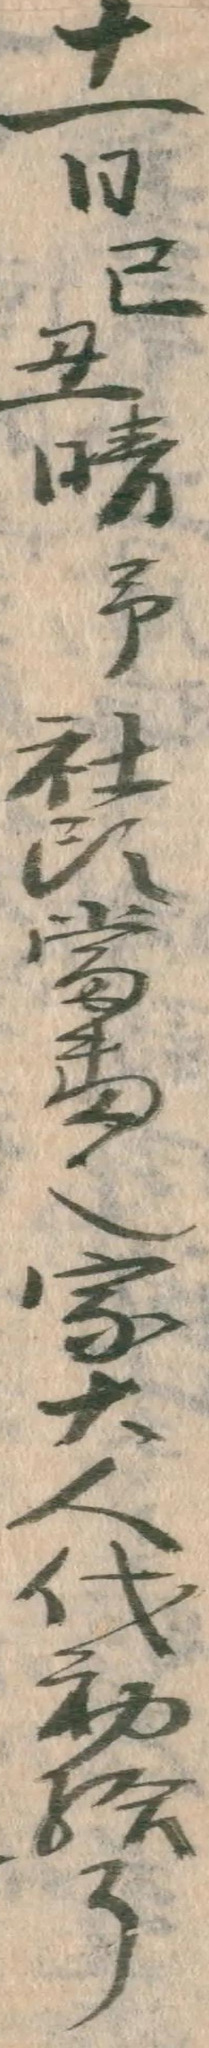十一日己丑晴、予社頭當番也、家大人代勤給了、
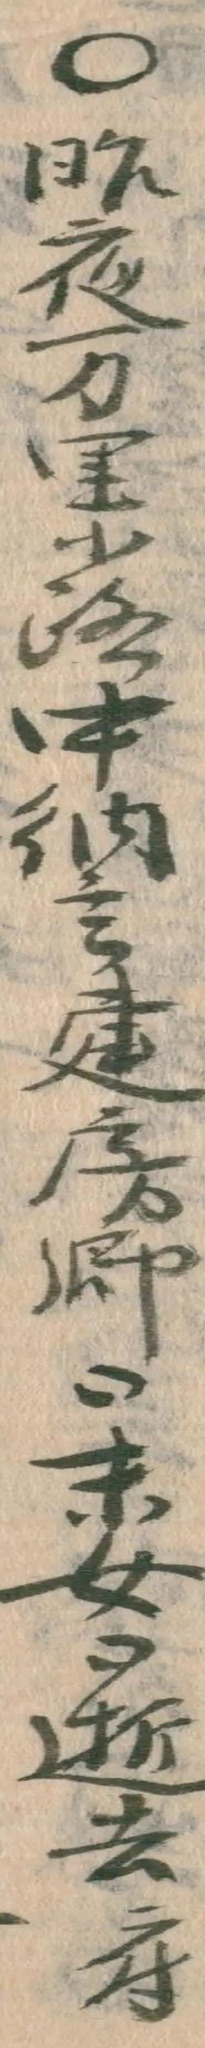○昨夜万里小路中納言建房卿御末女御逝去ニ付、
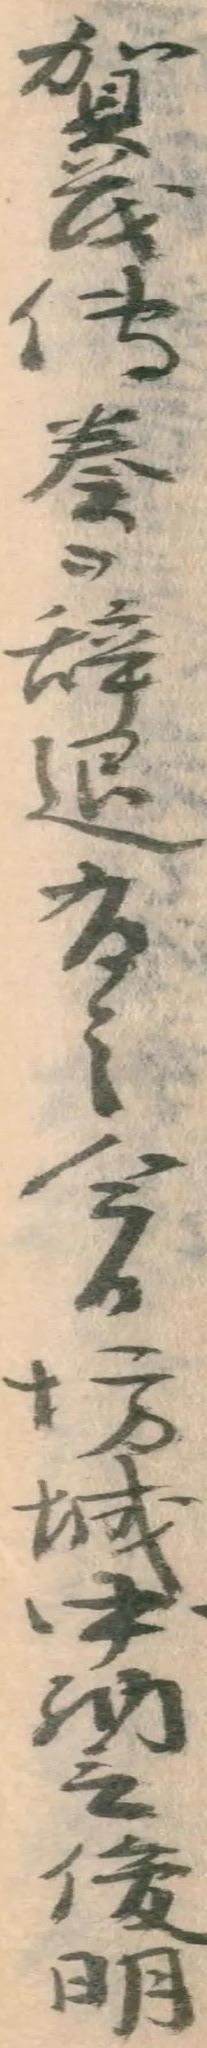賀茂傳奏御辞退有之、今日坊城中納言俊明
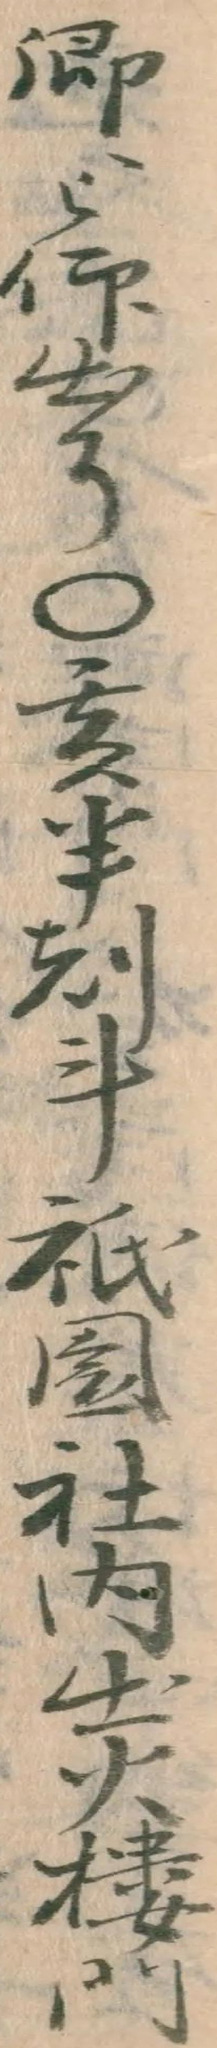郷へ被仰出了○亥半刻斗祇園社内出火楼門
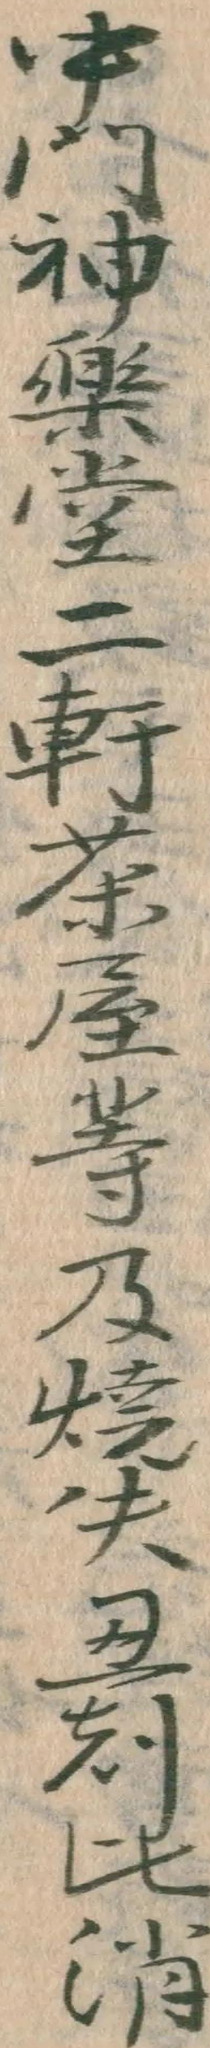中門神楽堂・二軒茶屋等及焼失、丑刻比消
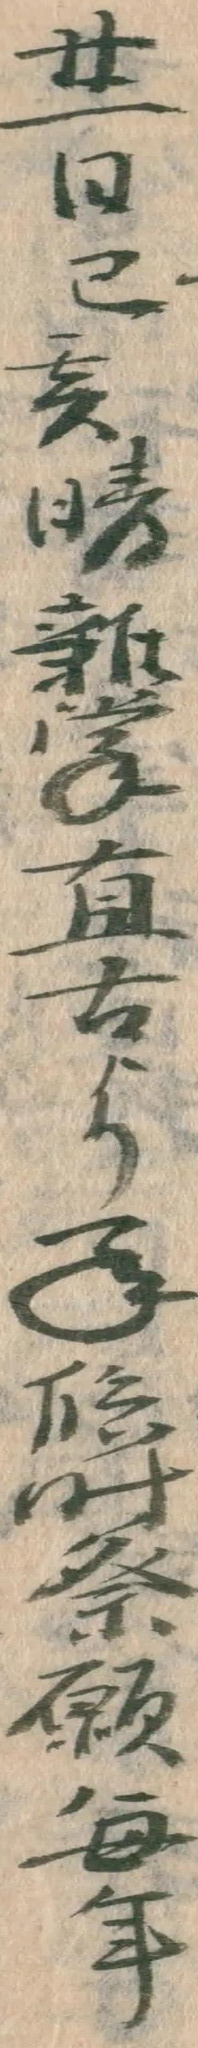廿一日己亥晴、雑掌直古より承臨時祭願毎年
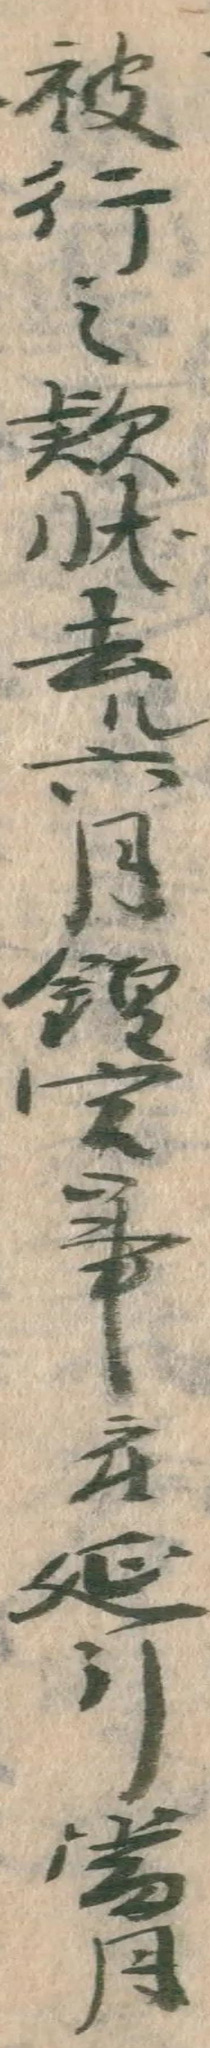被行之歎状、去ル六月銀買御事ニ付延引、當月
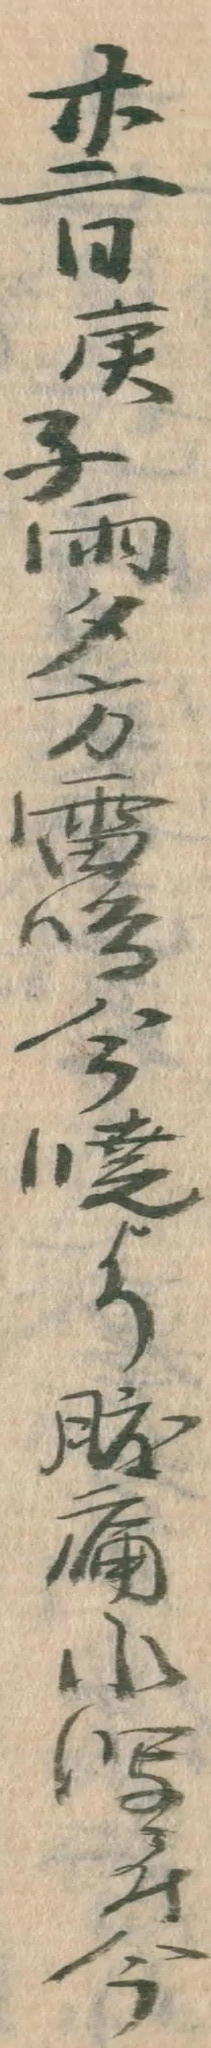廿二日庚子雨夕方雷鳴、今暁より腹痛小瀉ニ付、今
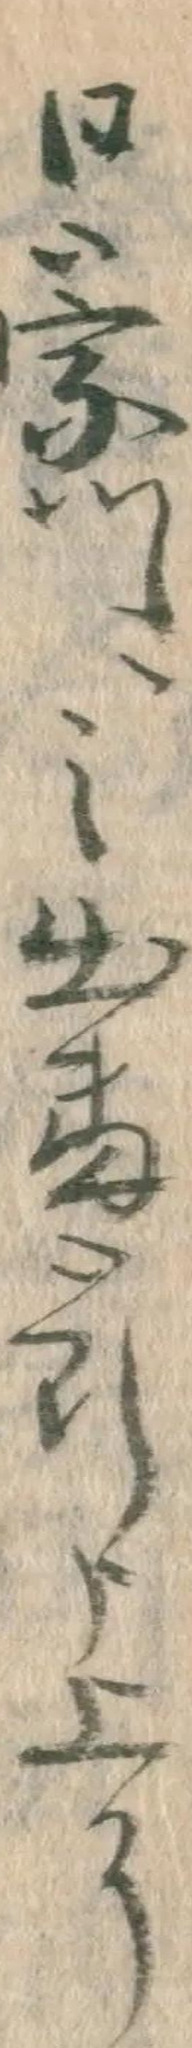日御家門へ之出番御断申上了、
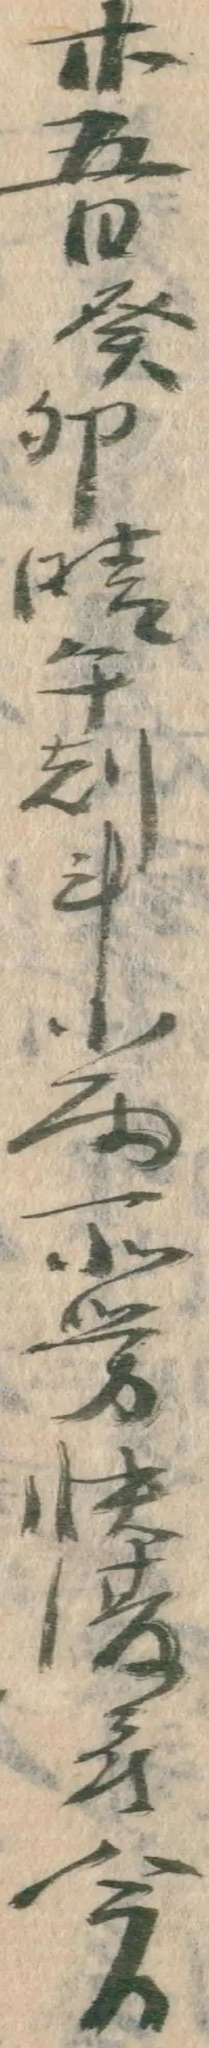廿五日癸卯晴午刻斗小雨、所労快復ニ付、今日
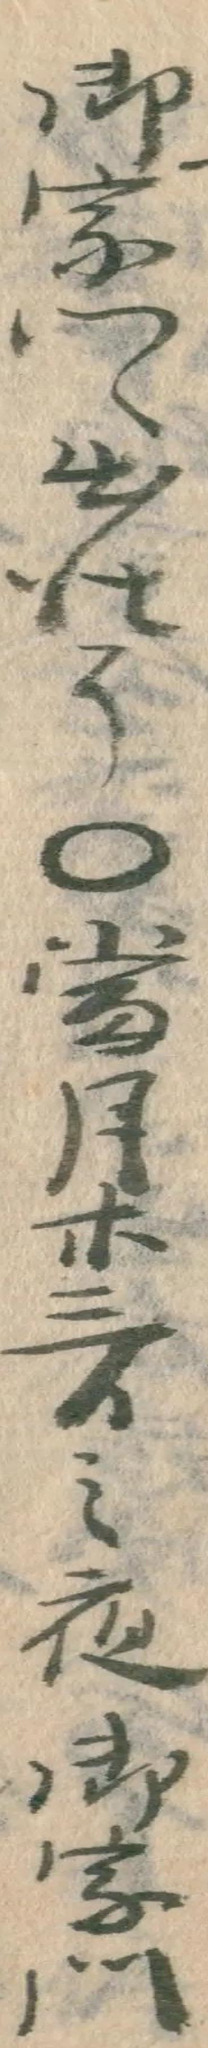御家門へ出仕了、○當月廿三日之夜御家門
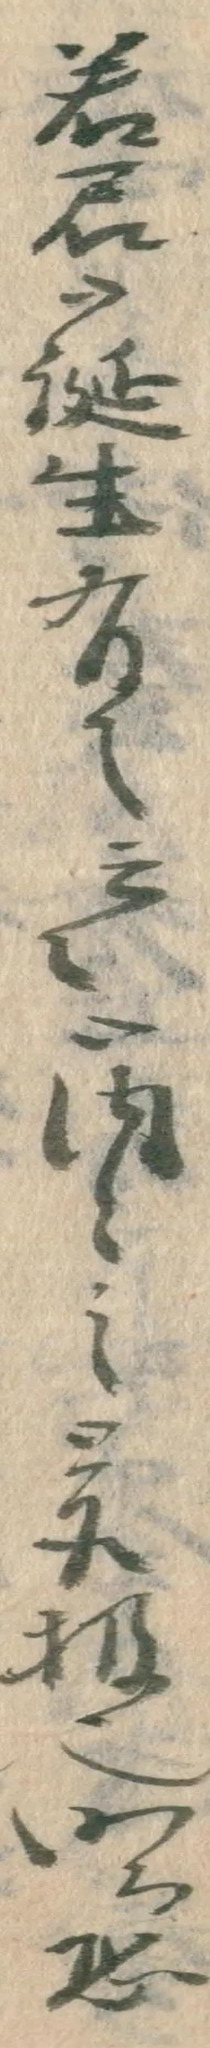若君御誕生有之云々、御内々之御取扱也、仍而恐
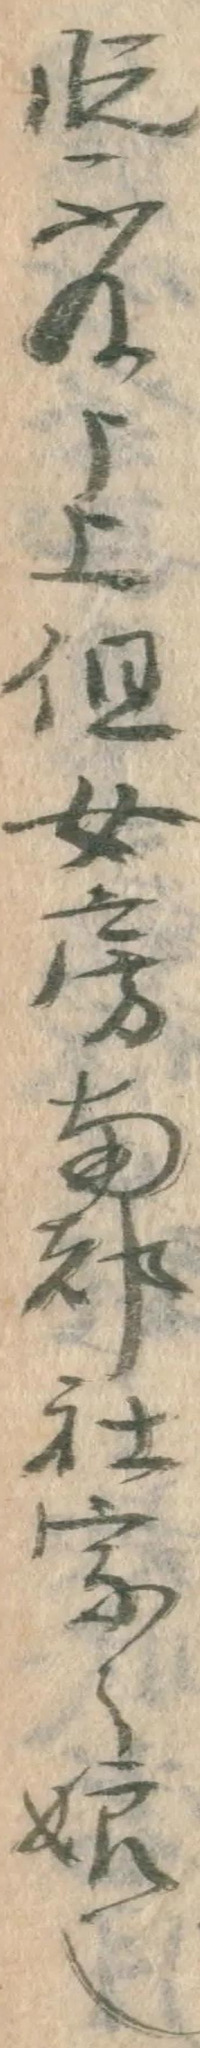悦不存申上、但女房南都社家之娘也
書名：賀茂社記録. 第63冊
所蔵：国立国会図書館 National Diet Library, JAPAN
